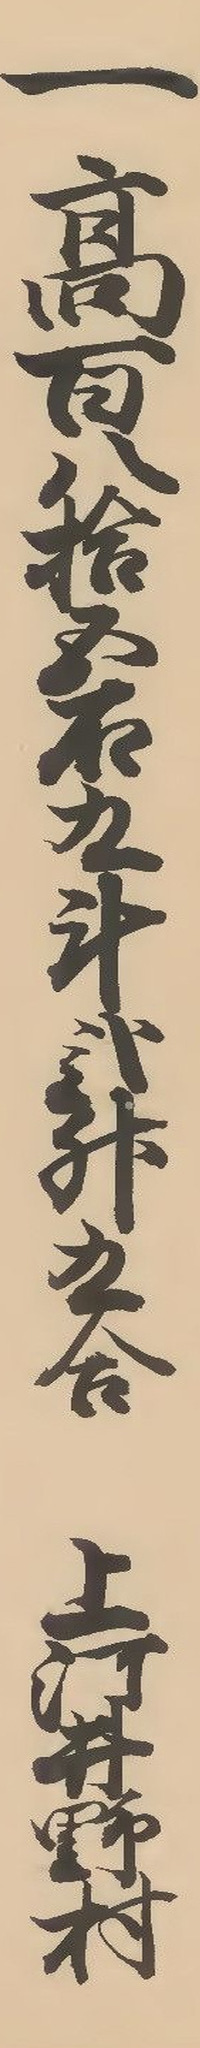一髙百八拾五石九斗弐升九合上河井野村
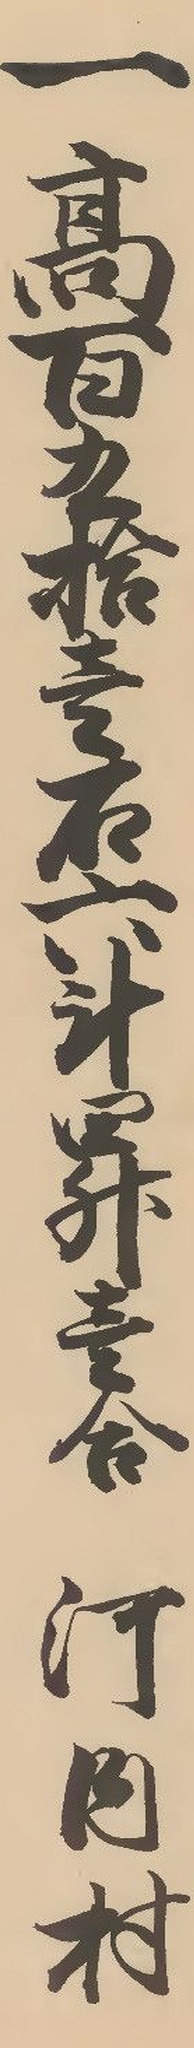一髙百九拾壱石六斗四升壱合河内村
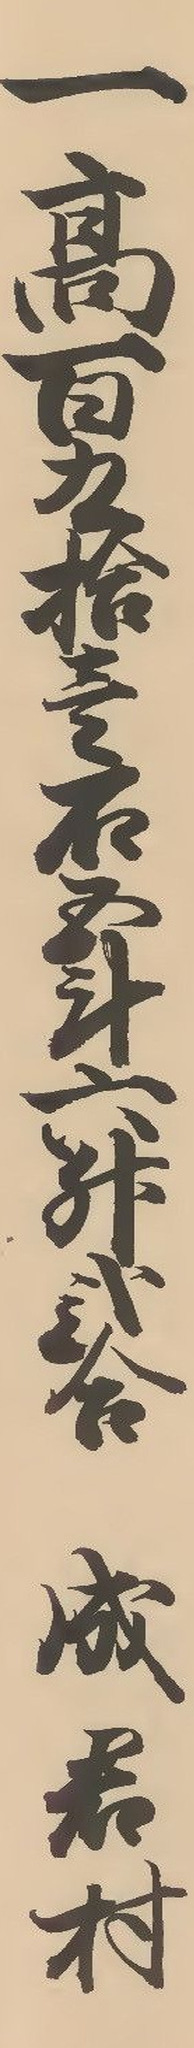一髙百九拾壱石五斗六升弐合成君村
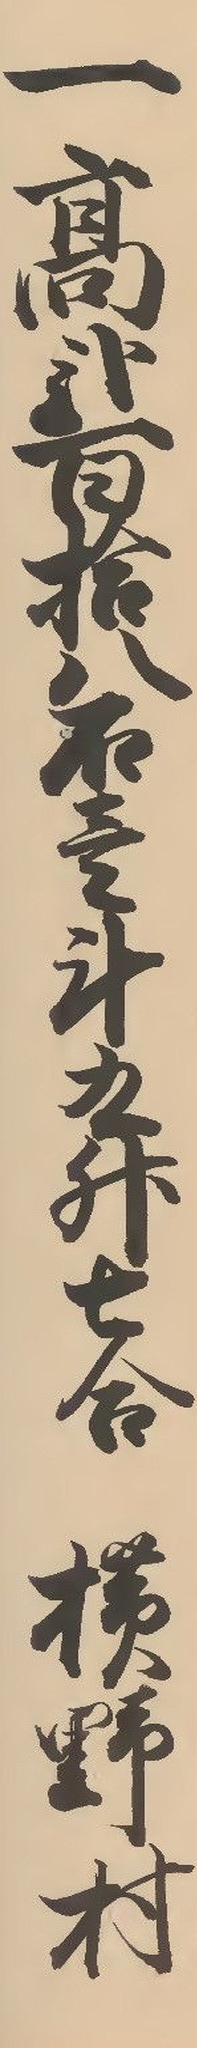一髙弐百拾八石壱斗九升七合横野村
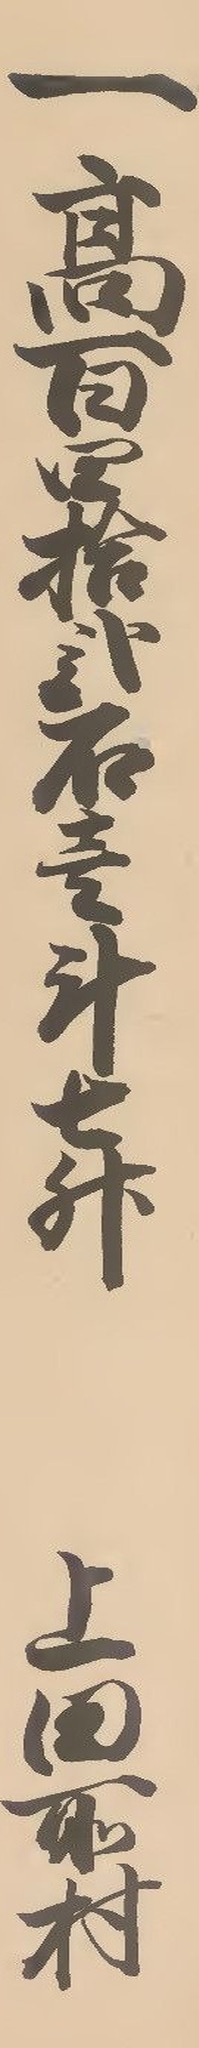一髙百四拾弐石壱斗七升上田所村
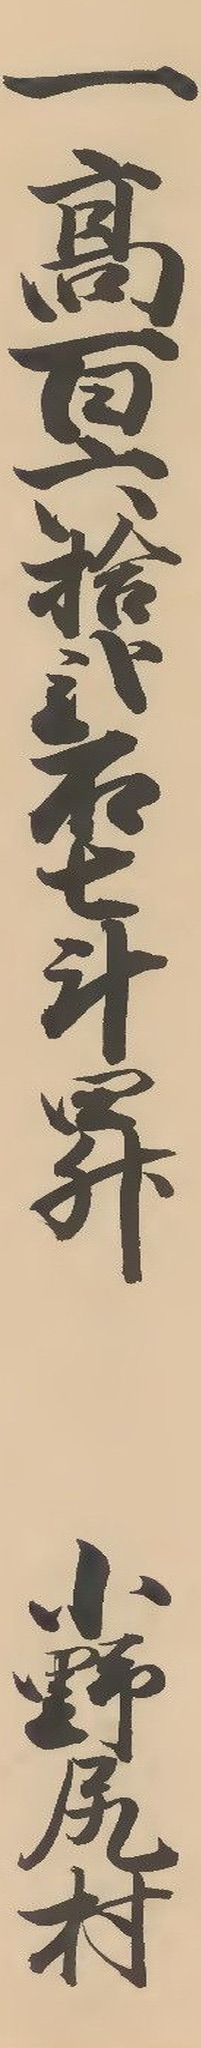一髙百六拾弐石七斗四升小野尻村
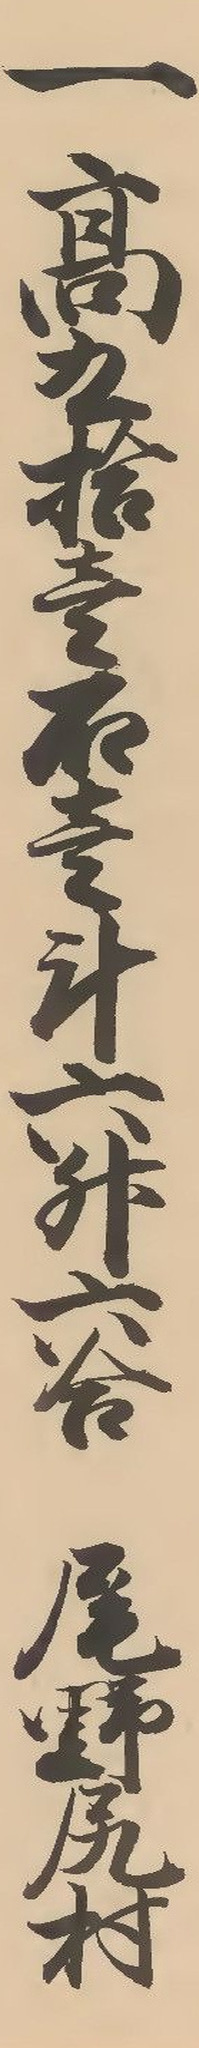一髙九拾壱石壱斗六升六合尾野尻村
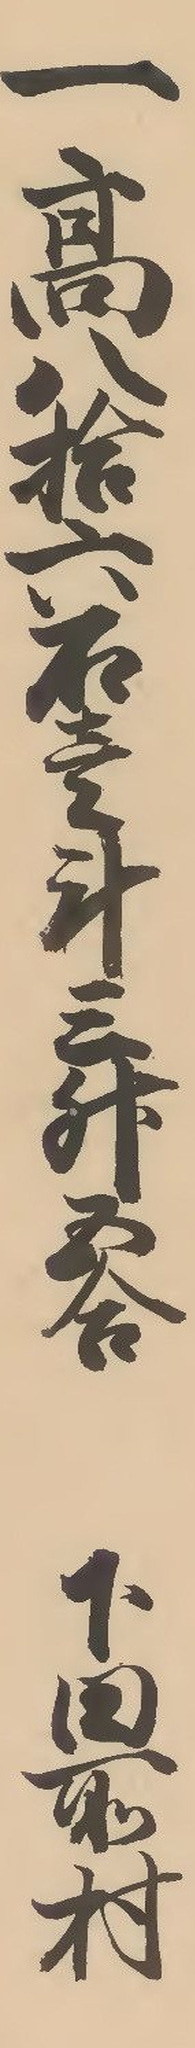一髙八拾六石壱斗三升五合下田所村

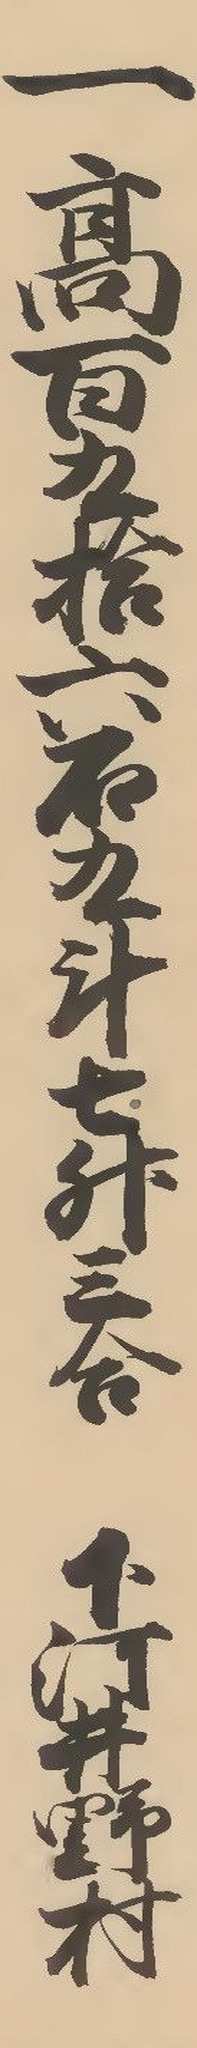一髙百九拾六石九斗七升三合下河井野村
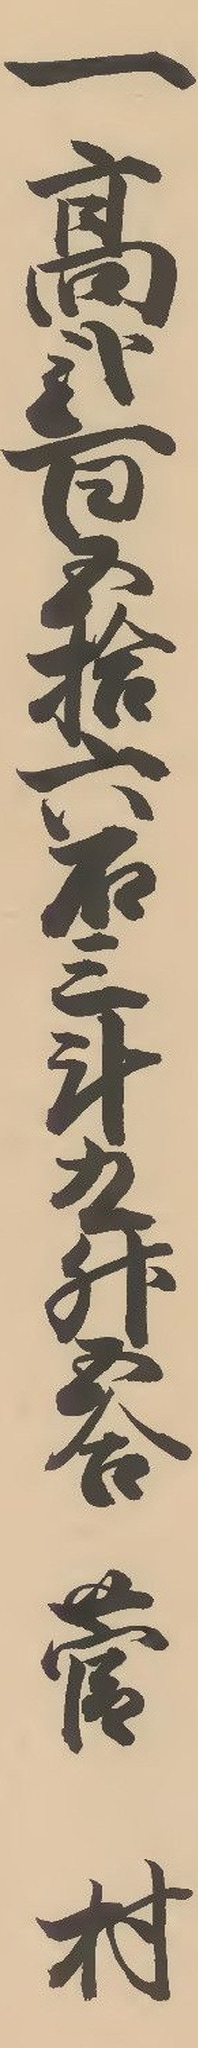一髙弐百五拾六石三斗九升五合菅村
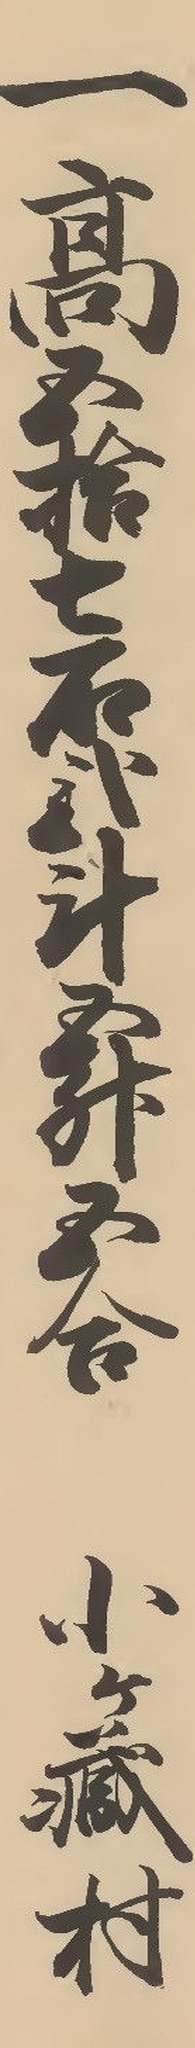一髙五拾七石弐斗五升五合小ケ藏村
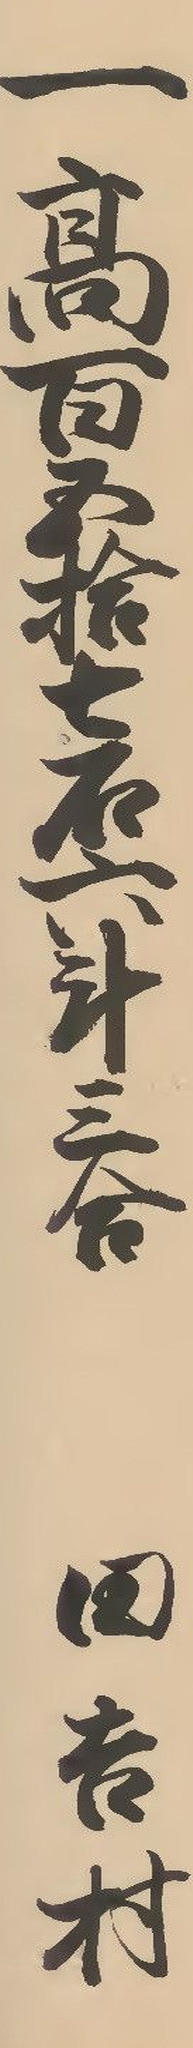一髙百五拾七石六斗三合田吉村
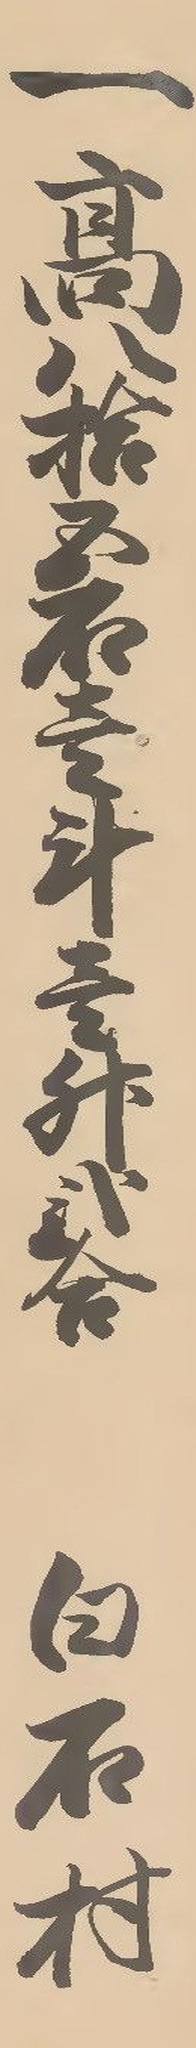一髙八拾五石壱斗壱升弐合白石村
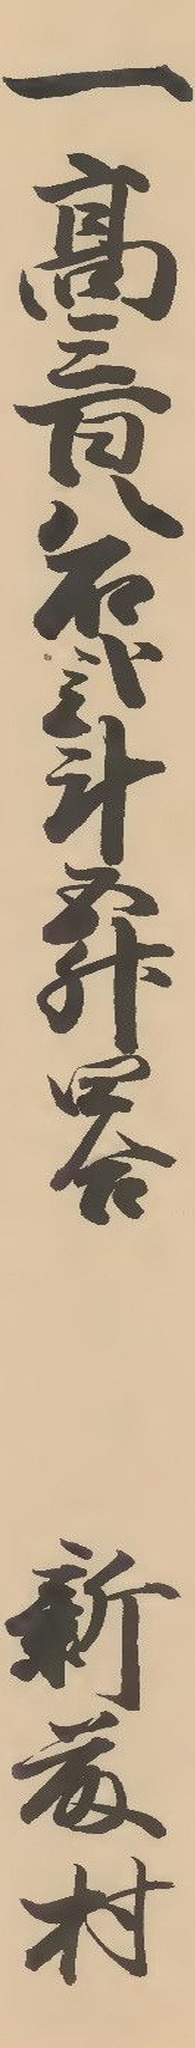一髙三百八石弐斗五升四合新藤村
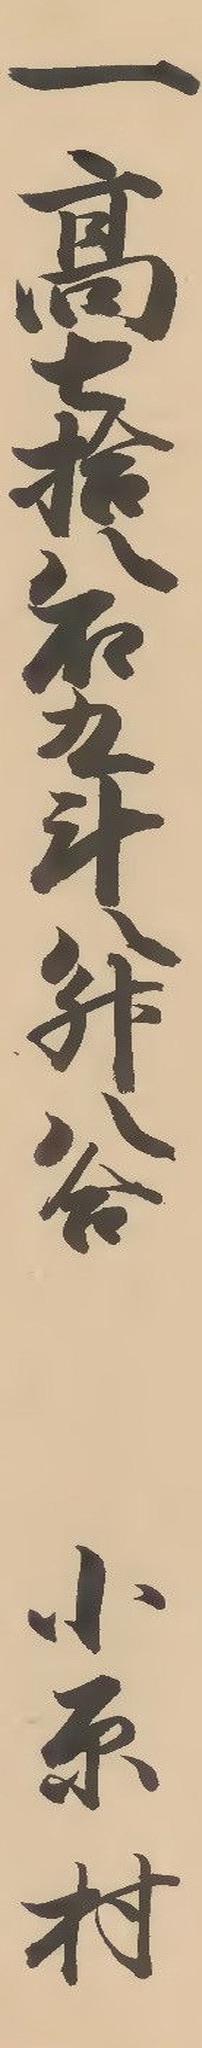一髙七拾八石九斗八升八合小原村
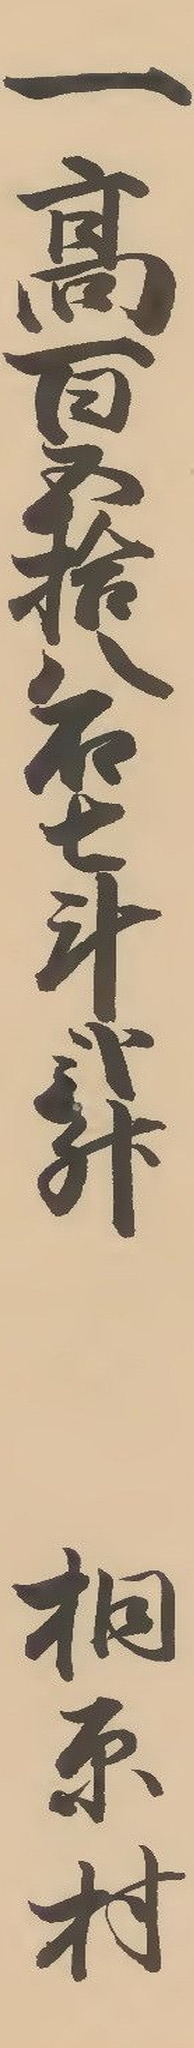一髙百五拾八石七斗弐升桐原村
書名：肥後国郷帳
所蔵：国立公文書館 National Archives of Japan
